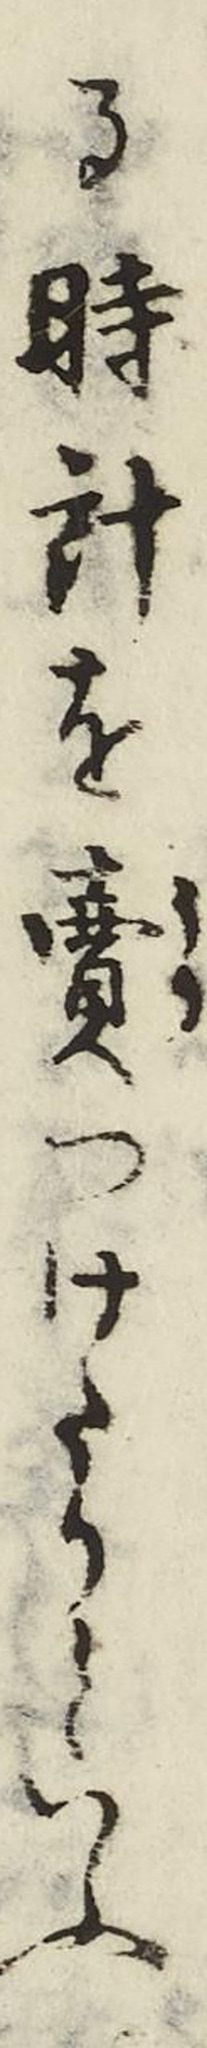る時計を売つけたりといふ
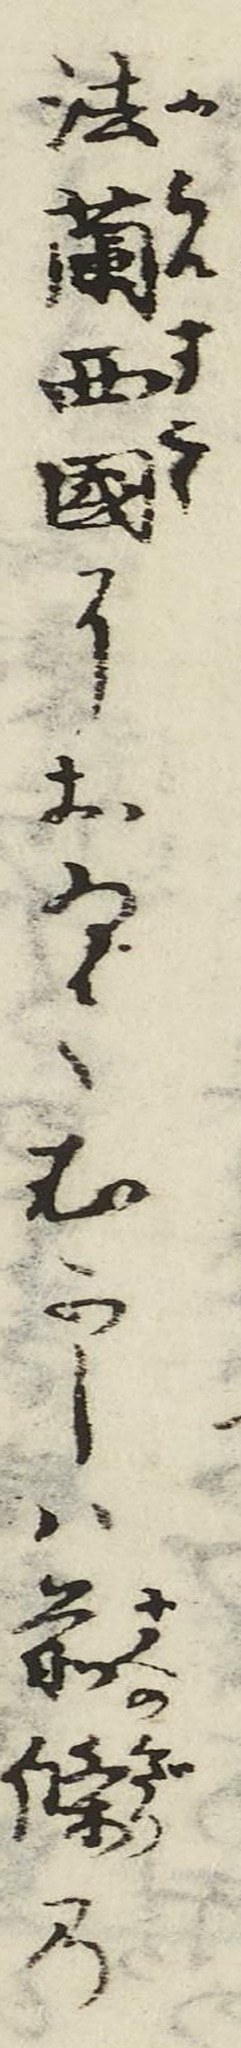法蘭西国におゐてむかしは前條の
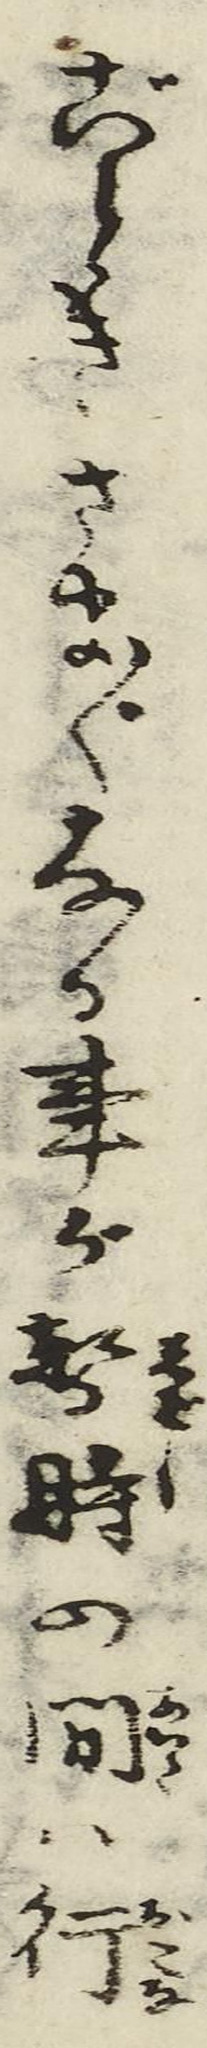ごときさま〴〵なる事が暫時の間は行
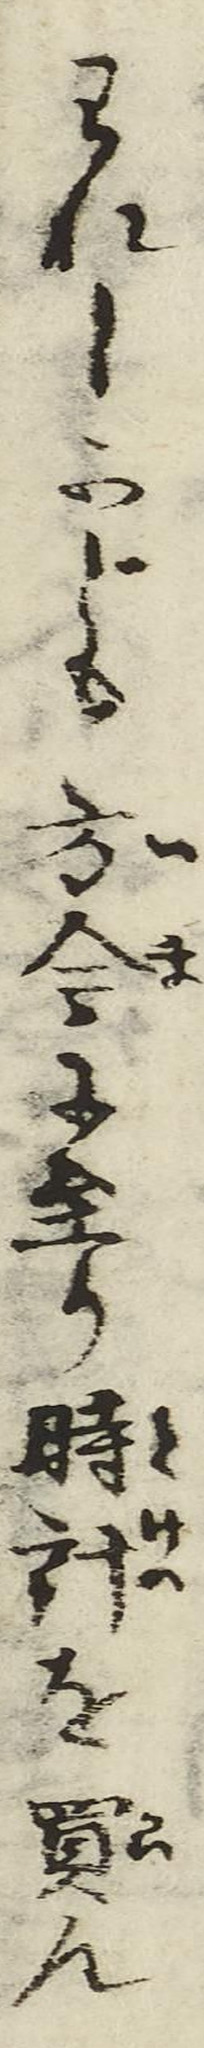われしかども方今に至り時計を買ん

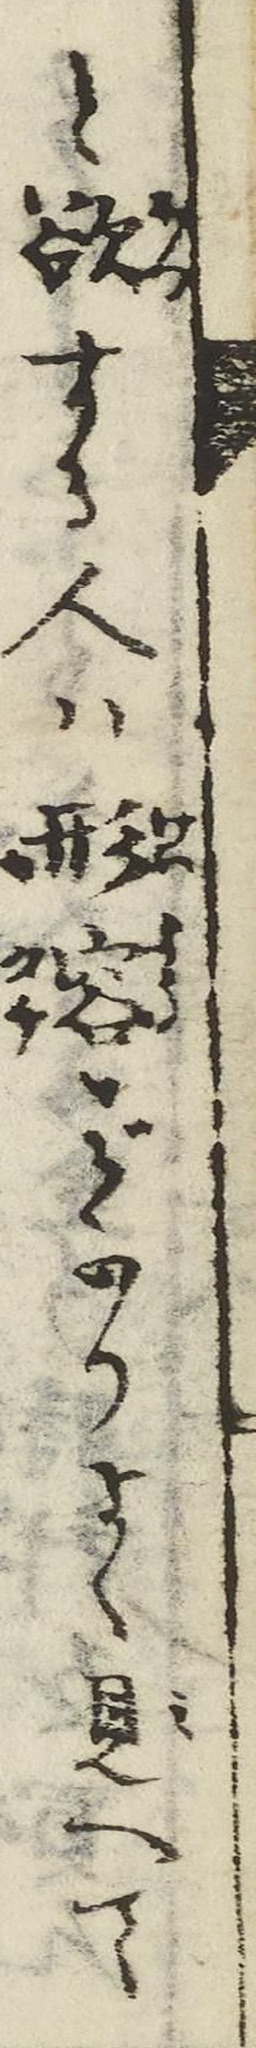と欲する人は形容ばかりよく見へて
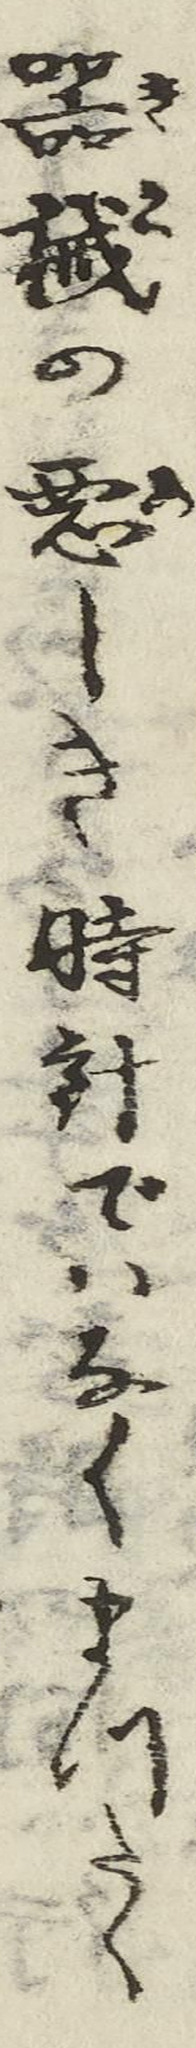器械の悪しき時計ではなくまつたく
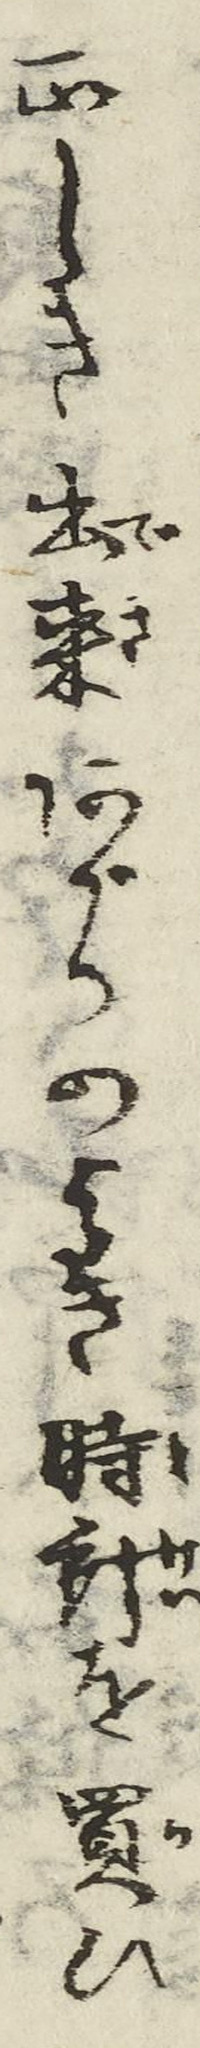正しき出来あがりのよき時計を買ひ
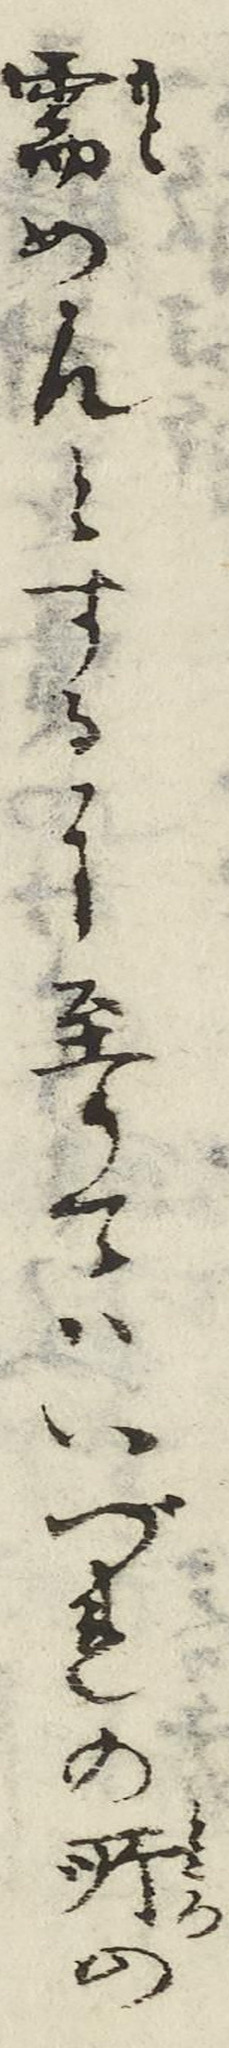需めんとするに至りてはいづれの所の
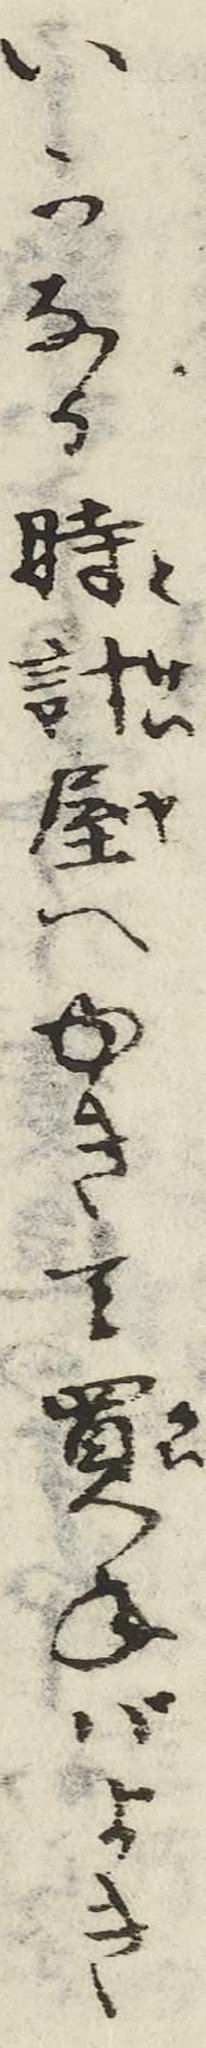いかなる時計屋へゆきて買ねばよき
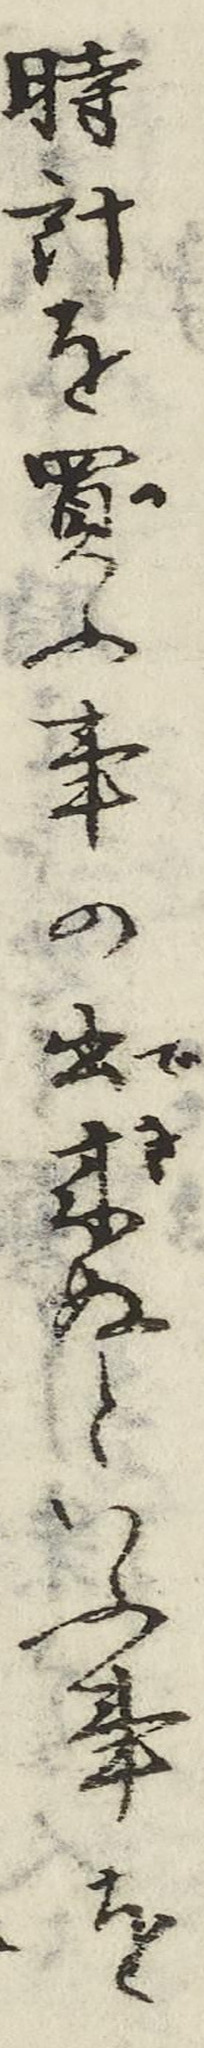時計を買ふ事の出来ぬといふ事を
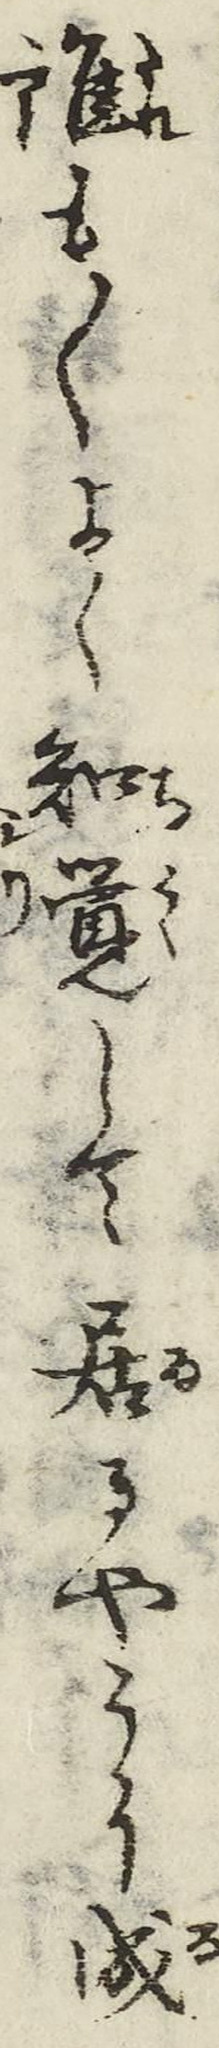誰も〳〵よく知覚して居るやうに成
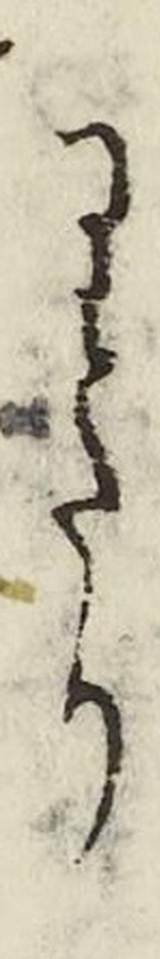りたり
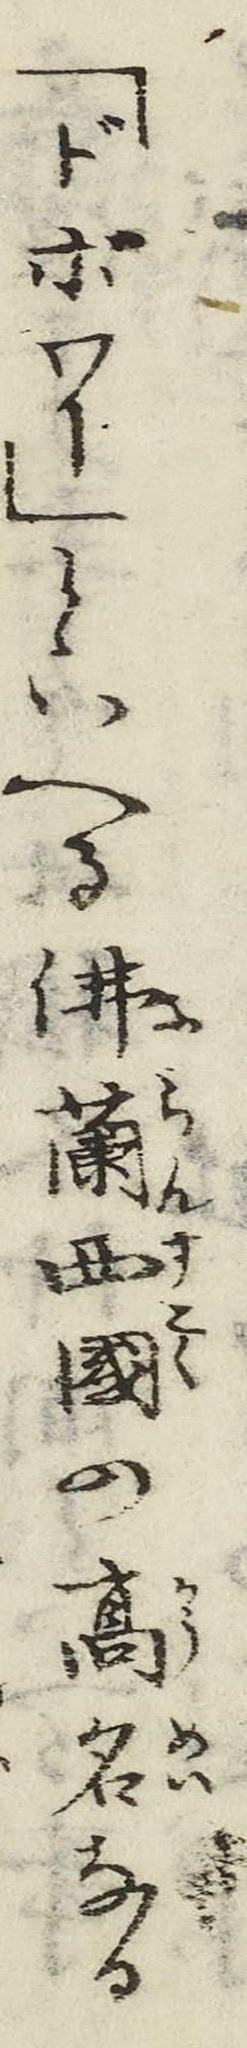「ドボワー」といへる佛蘭西国の高名なる
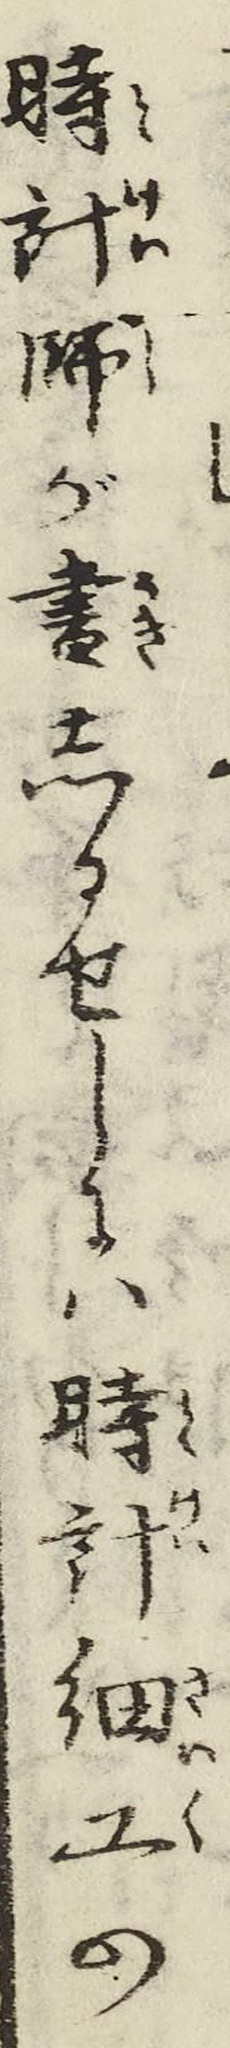時計師が書しるせしには時計細工の
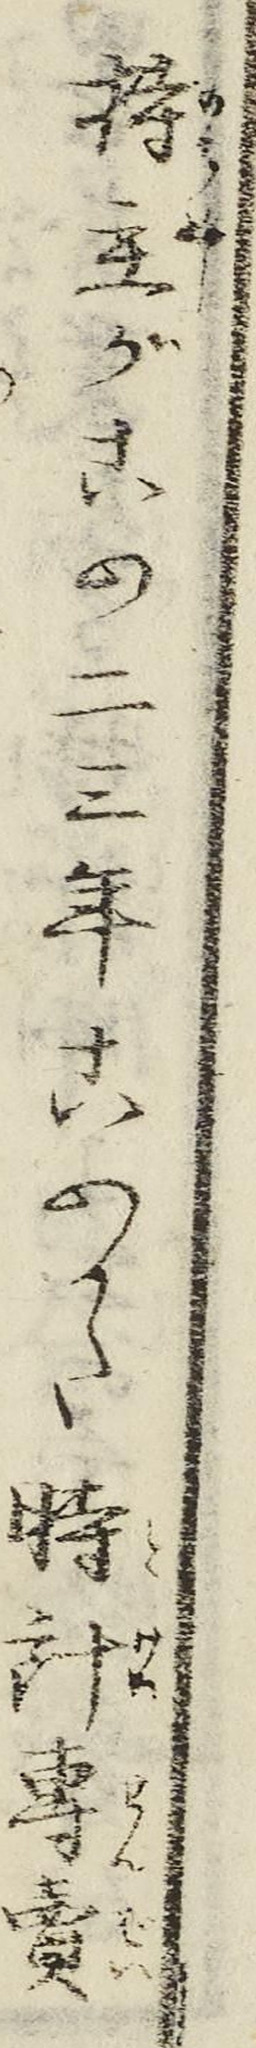持主がこのニ三年このかた時計専売
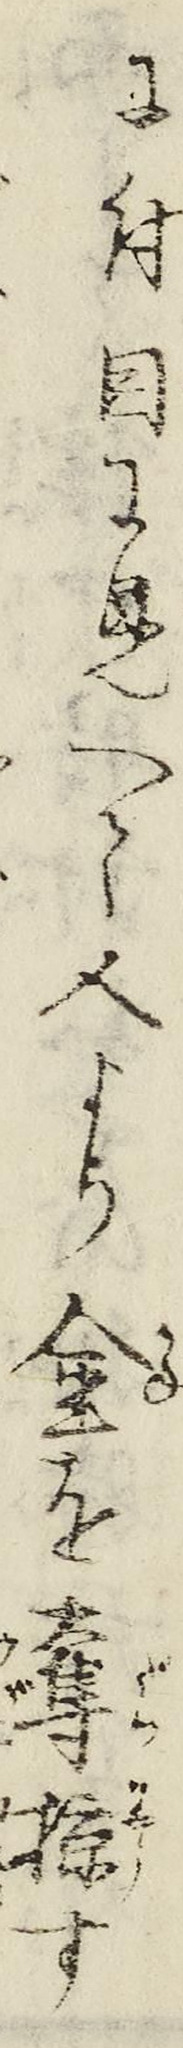に付目に見へて人より金を奪掠す
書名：[時計に関する冊子]
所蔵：東京大学地震研究所図書室 Earthquake Research Institute Library, The University of Tokyo, JAPAN
